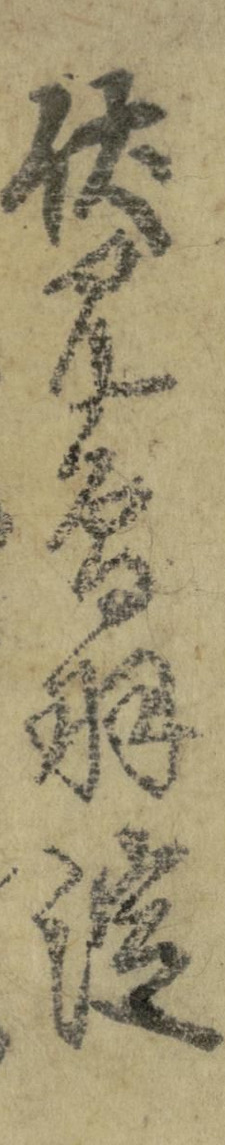伏見鳥羽淀
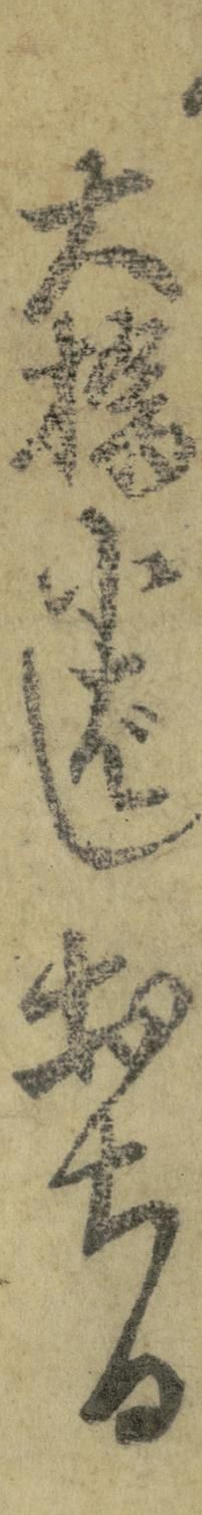大橋小ばしおちる
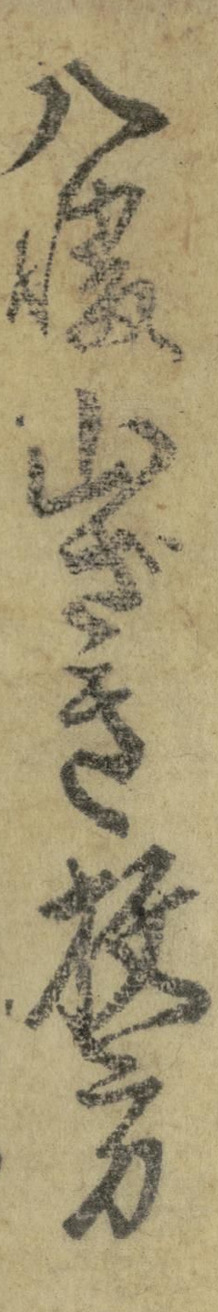八幡山ざき枚方
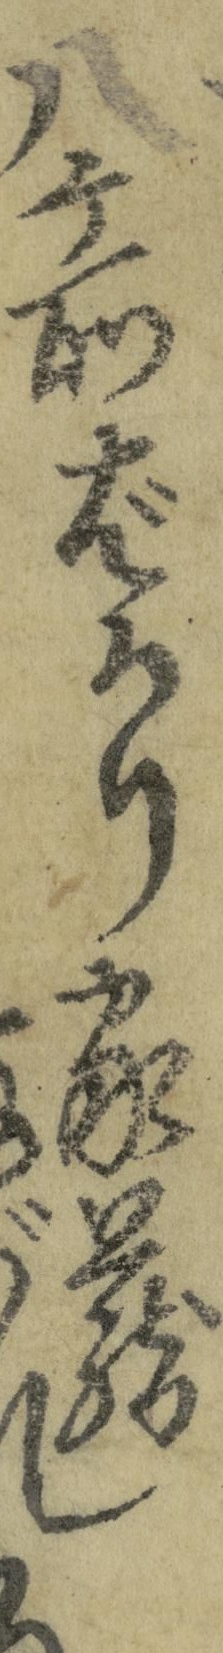八ヶ所ばかり家蔵
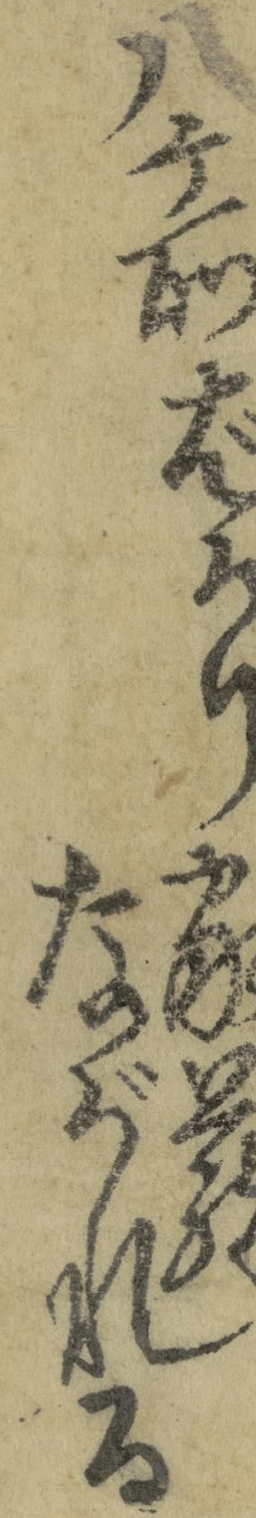ながれる
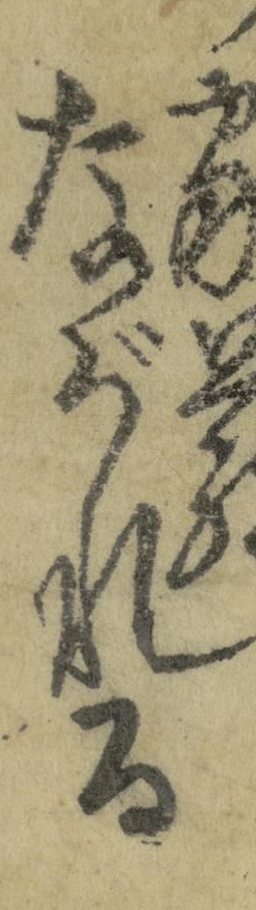ながれる
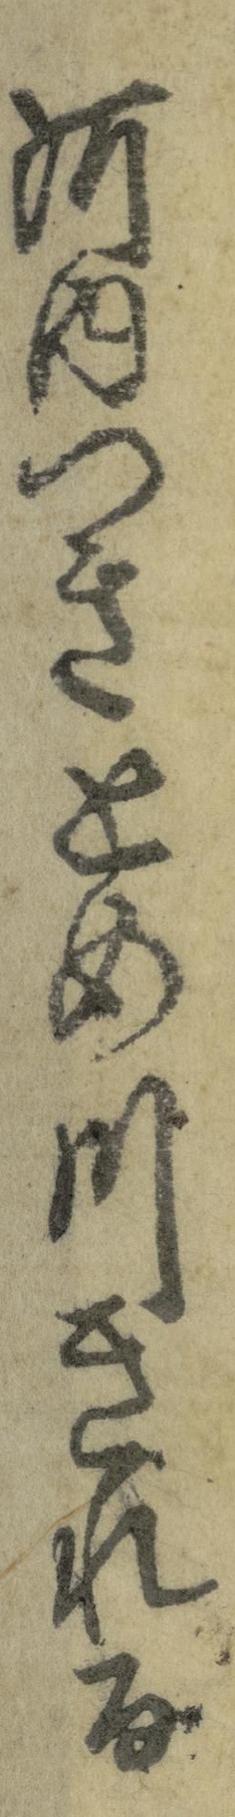河内つきとめ川きれる
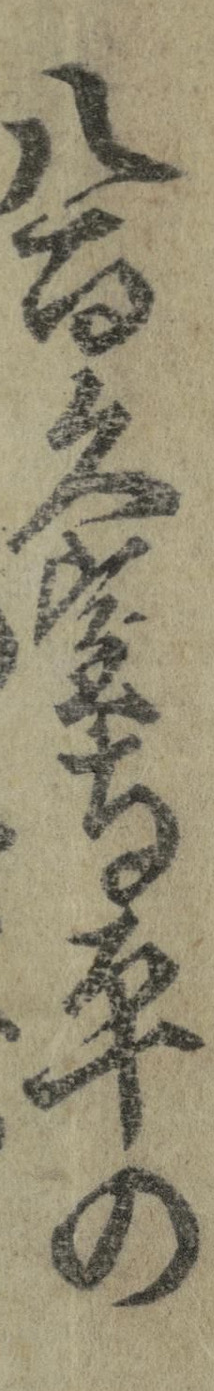八百久室寺平の
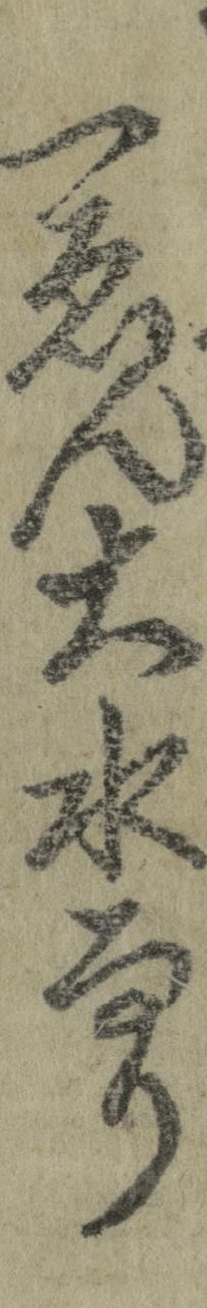一ゑん大水なり
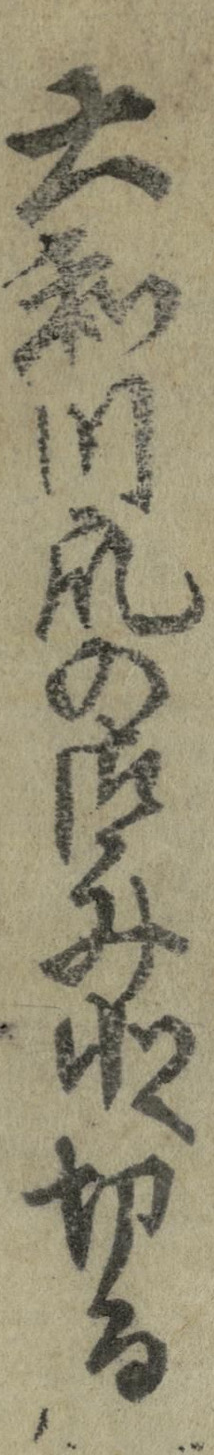大和川尻のつゝみ北へ切る
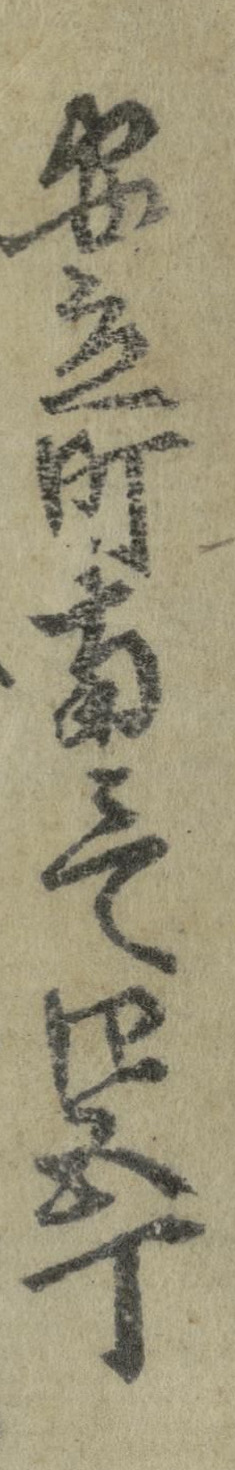安立町南にて四五丁
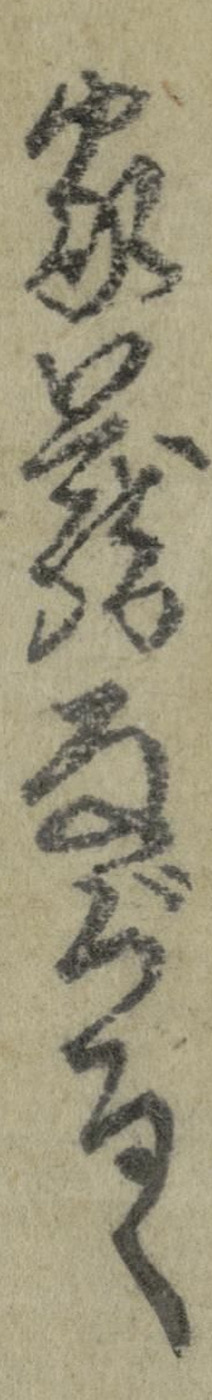家蔵ながるゝ
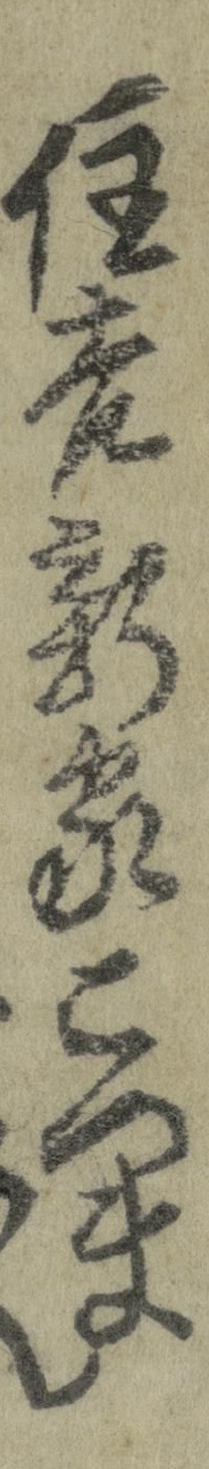住𠮷新家こつま
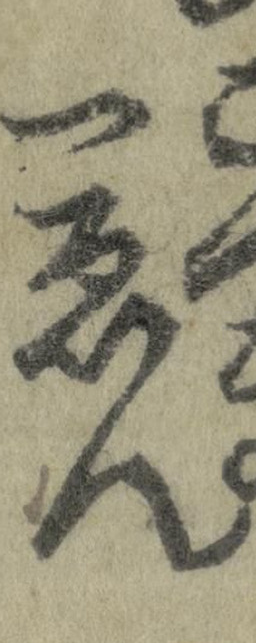一ゑん
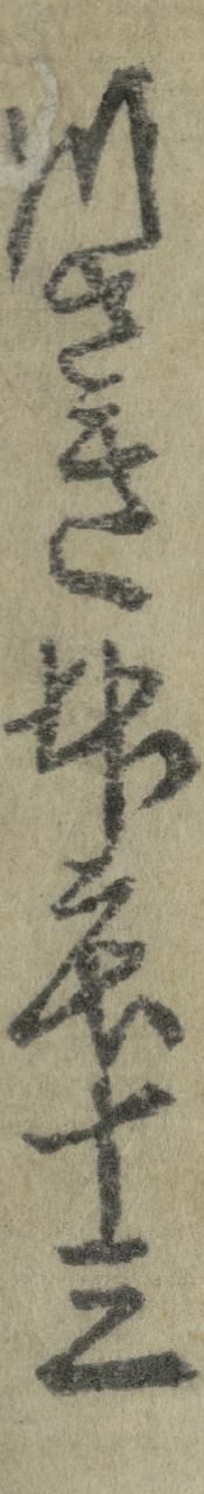川さき北庄十三
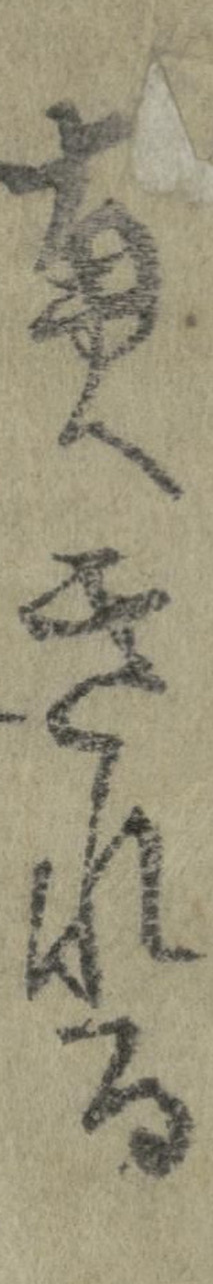南へきれる
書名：慶応四辰五月　五畿内大水圖
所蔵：東京大学地震研究所図書室 Earthquake Research Institute Library, The University of Tokyo, JAPAN
